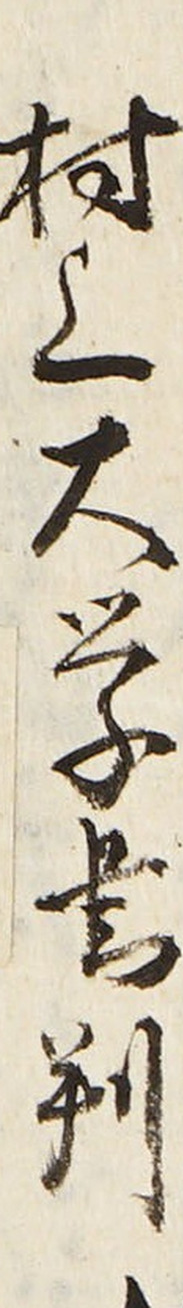村上大学書判
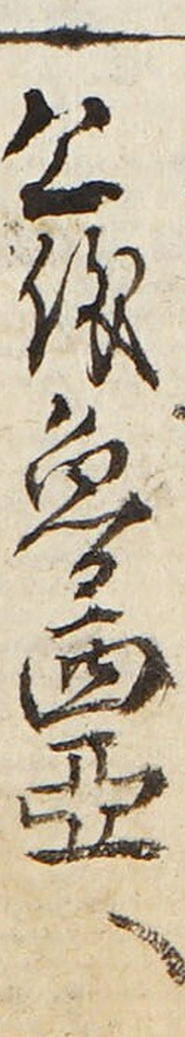公儀魯西亜へ
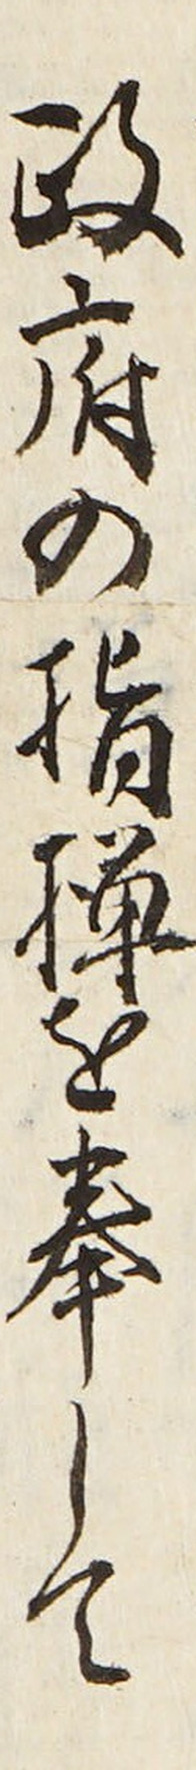政府の指揮を奉して
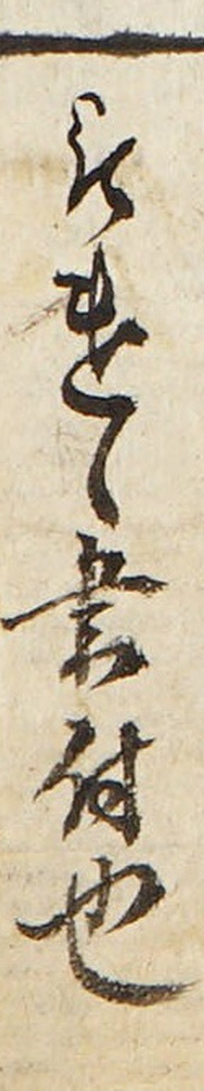被遣候書付也
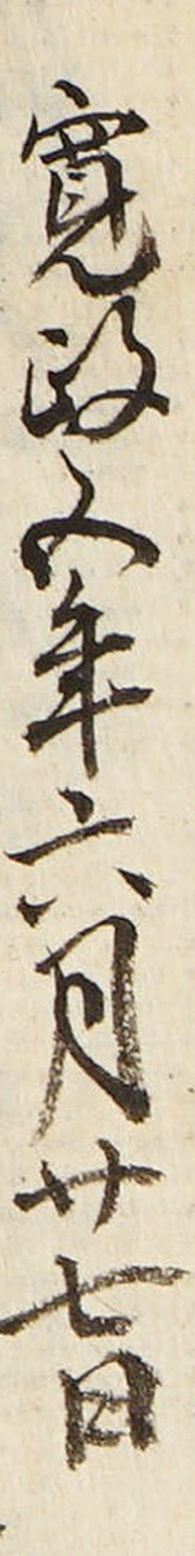寛政五年六月廿七日

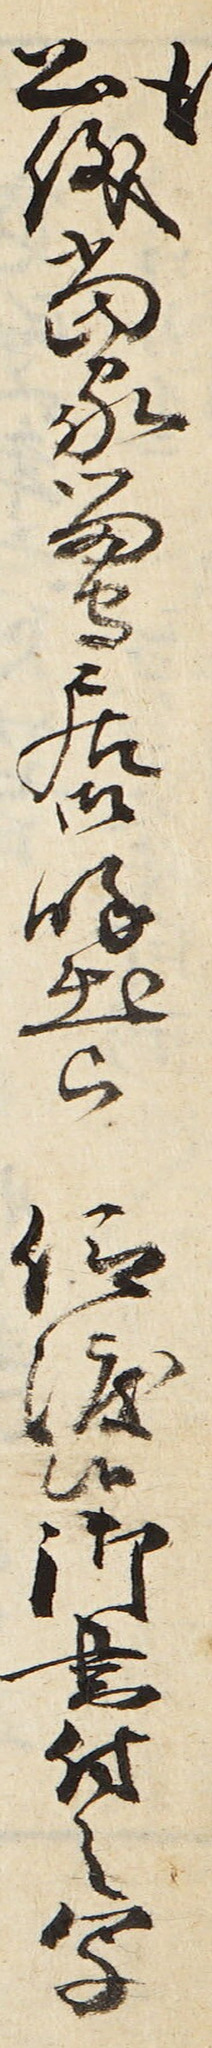公儀当家留守居御呼出被仰渡候御書付之写
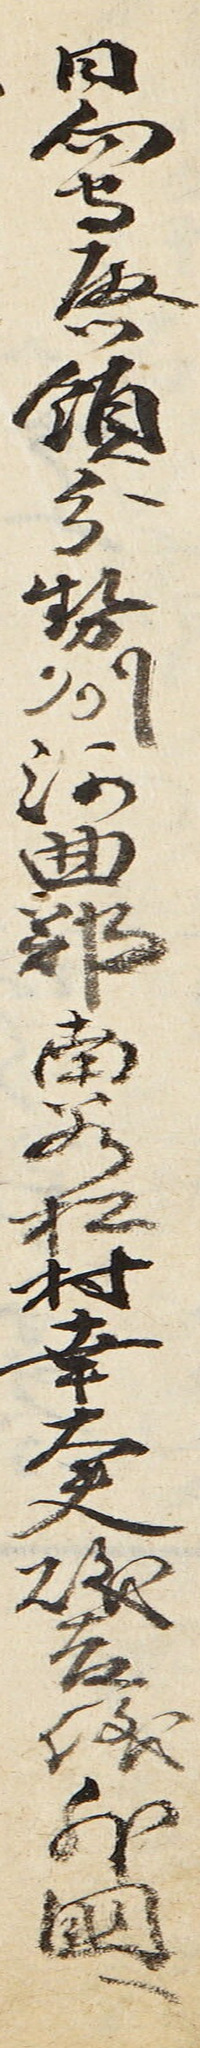日向守殿御領分勢州河曲郡南若松村幸太夫磯吉儀外国へ
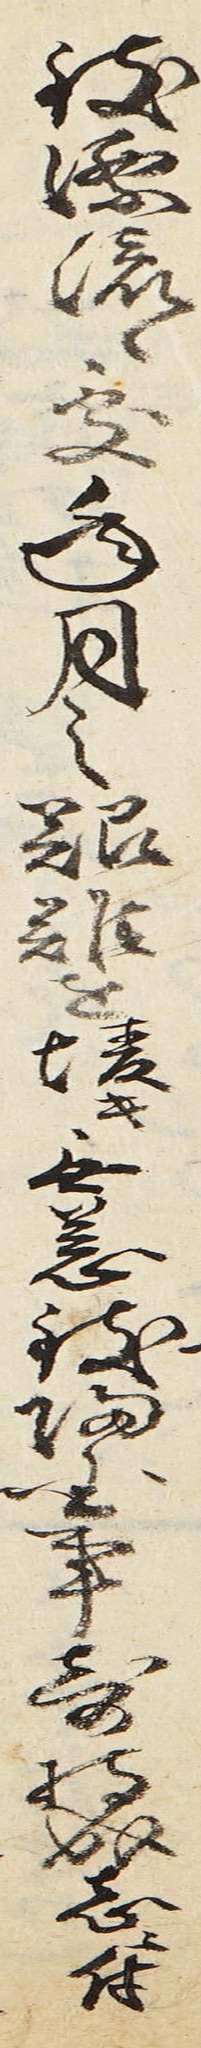致漂流候処年月之艱難を凌き無恙致帰国事奇特成志に付
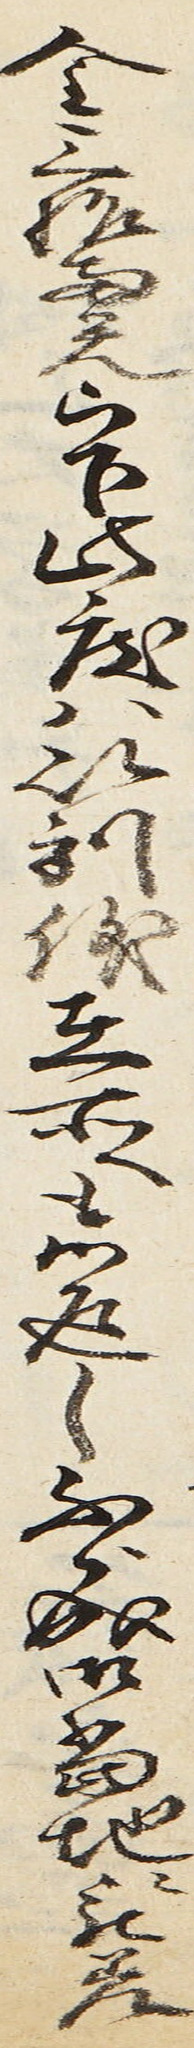金三拾両宛被下此度は以別儀在所へも御返し不被成御当地に被差
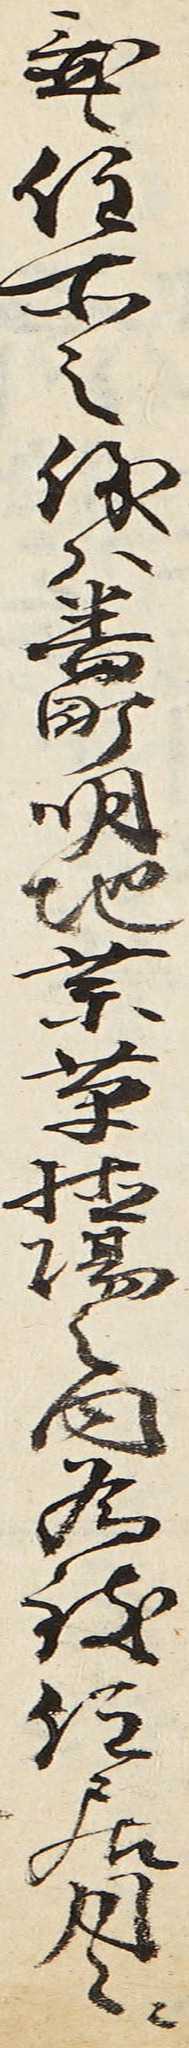置候住所之儀は番町明地薬草植場之内為致住居月々に
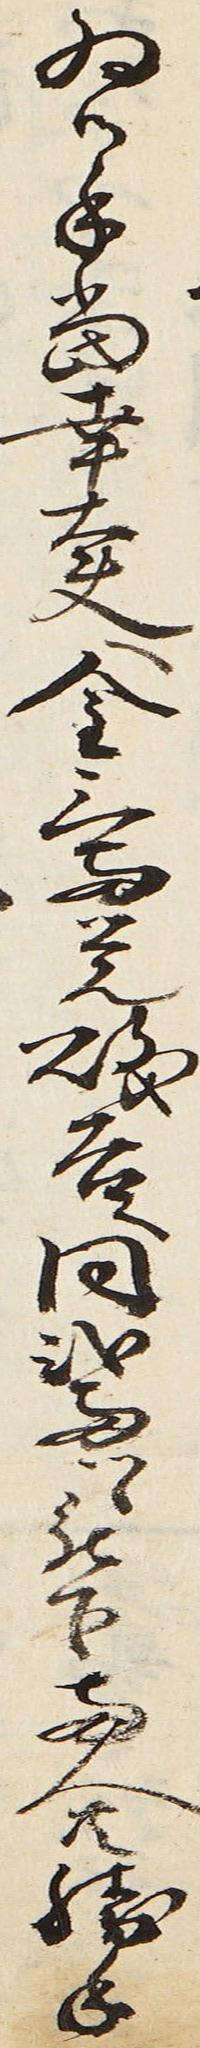為御手当幸太夫へ金三両宛磯吉へ同弐両つゝ被下両人共勝手
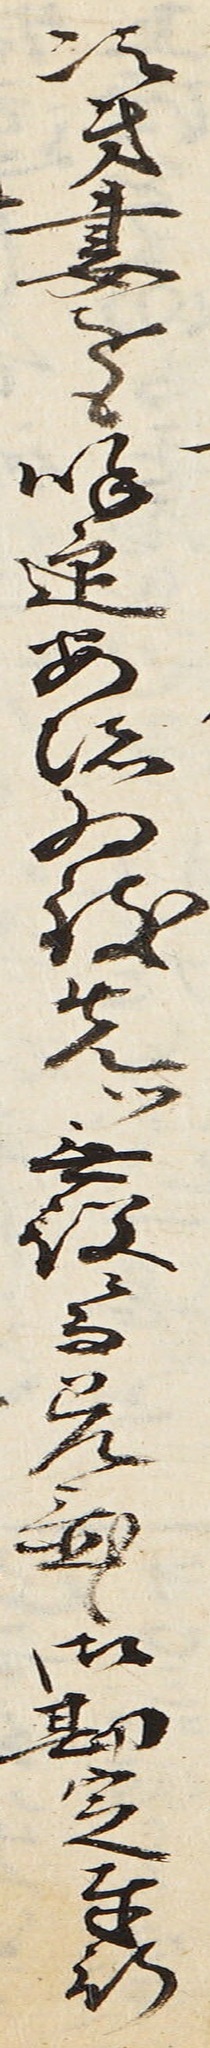次第妻をも呼迎安堵為致先つ無役にて差置候御勘定奉行
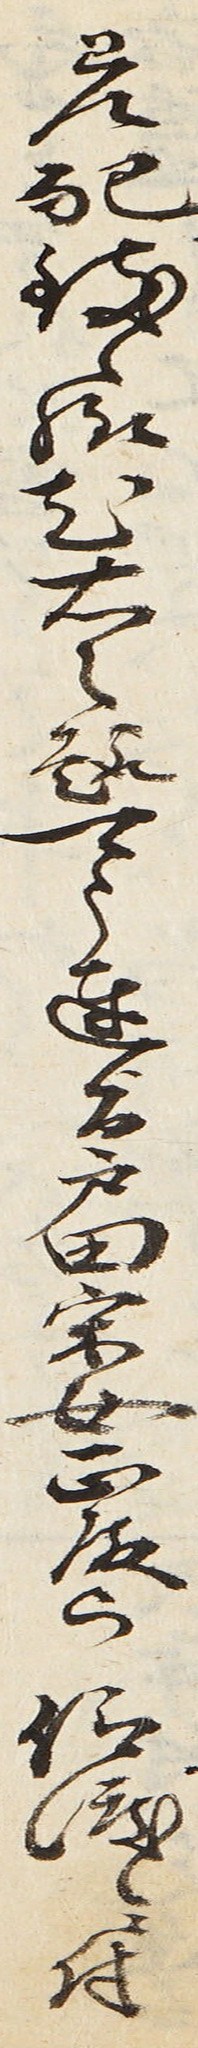差配致候様尤右之趣可申達旨戸田采女正殿被仰渡候に付
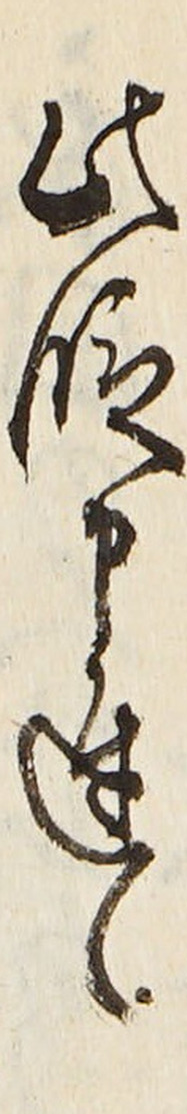此段申達候
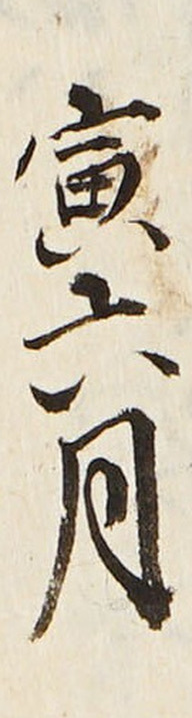寅六月
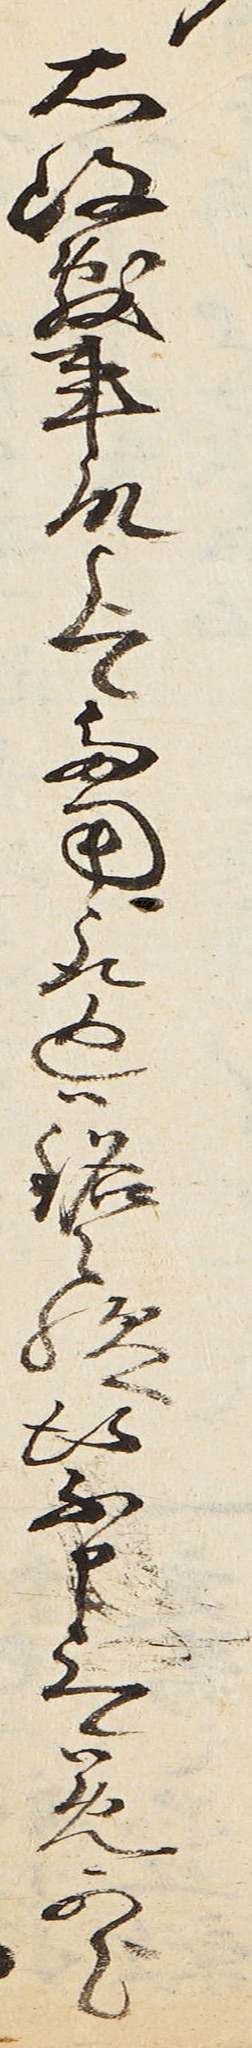右珎敷事故申上候両用被取込は銘々様へ得不申上候御免可申候
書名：漂民御覧之記
